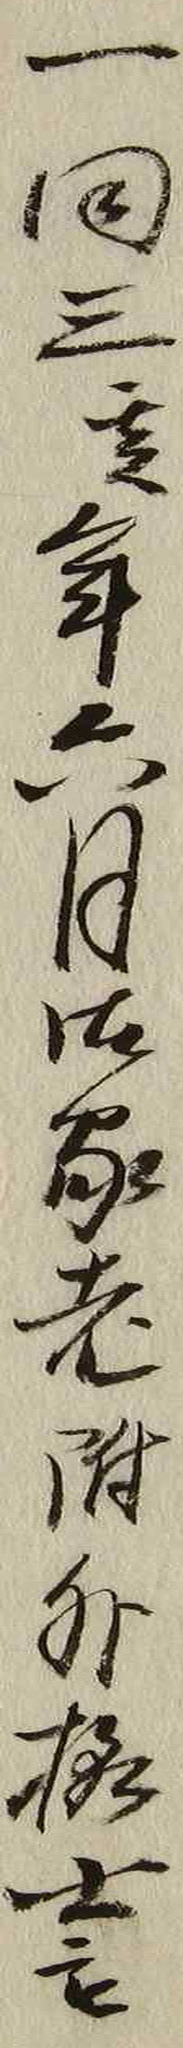一同三亥年六月御家老附外様士被
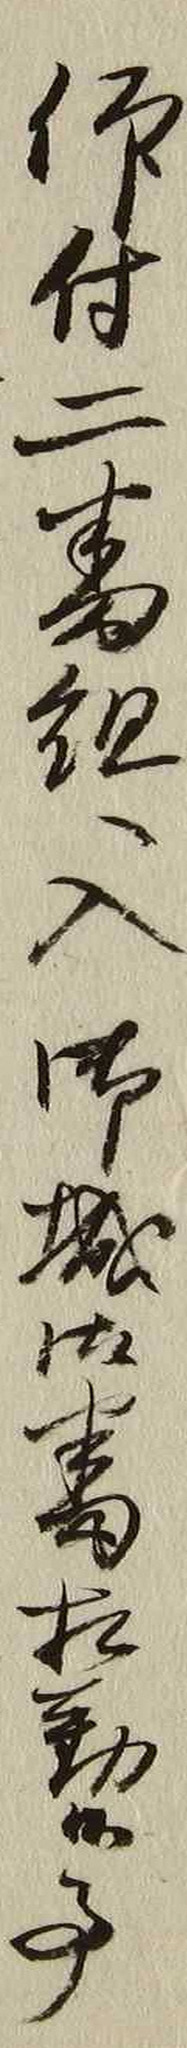仰付二番組へ入御城御番御相勤候事
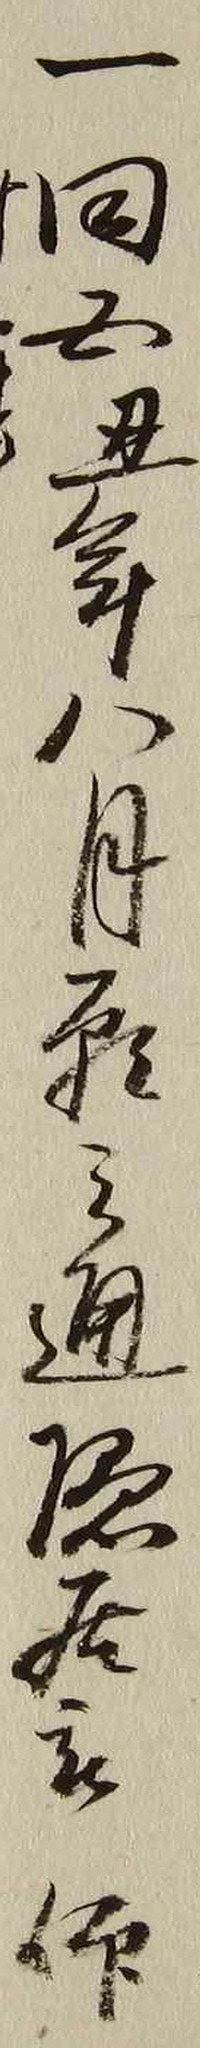一同五丑年八月願之通隠居被仰
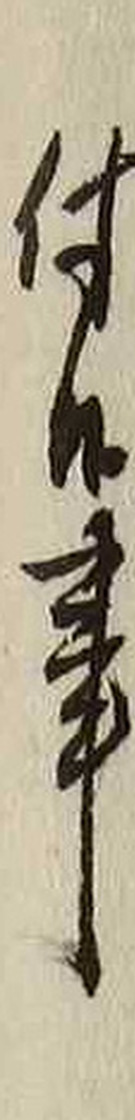付候事
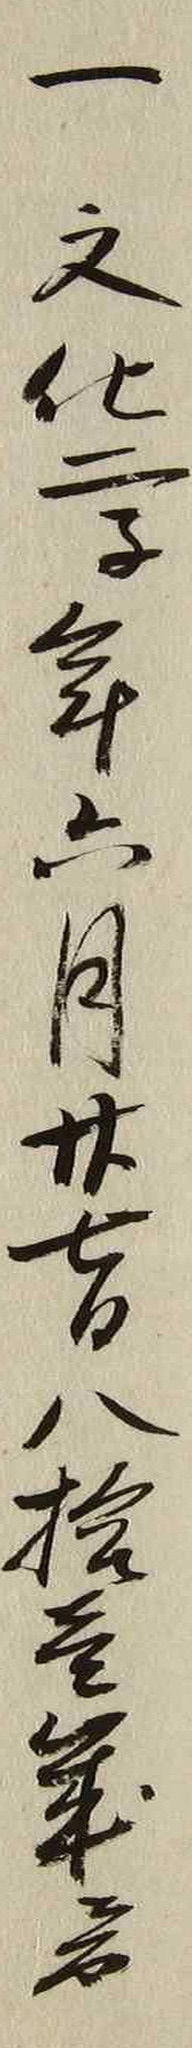一文化二子年六月廿七日八拾壱歳ニ而
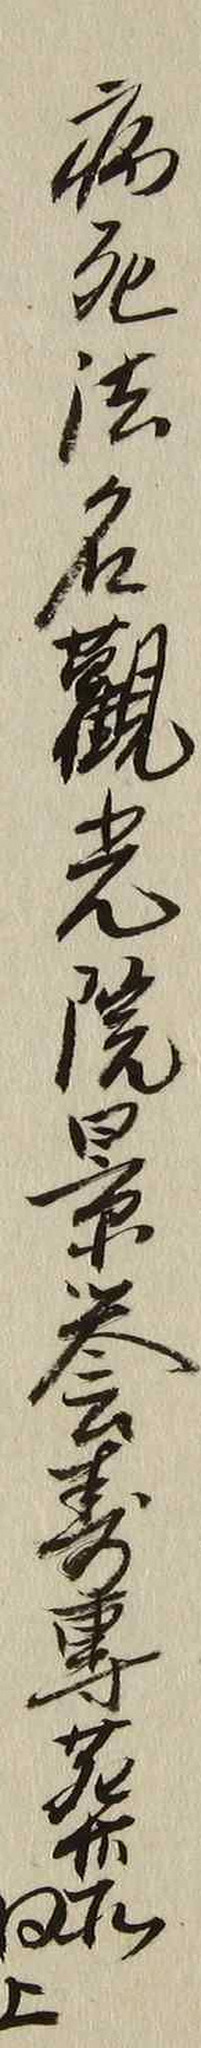病死法名観光院景誉寿専葬所同上
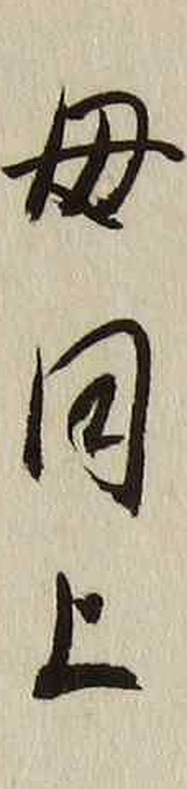母同上
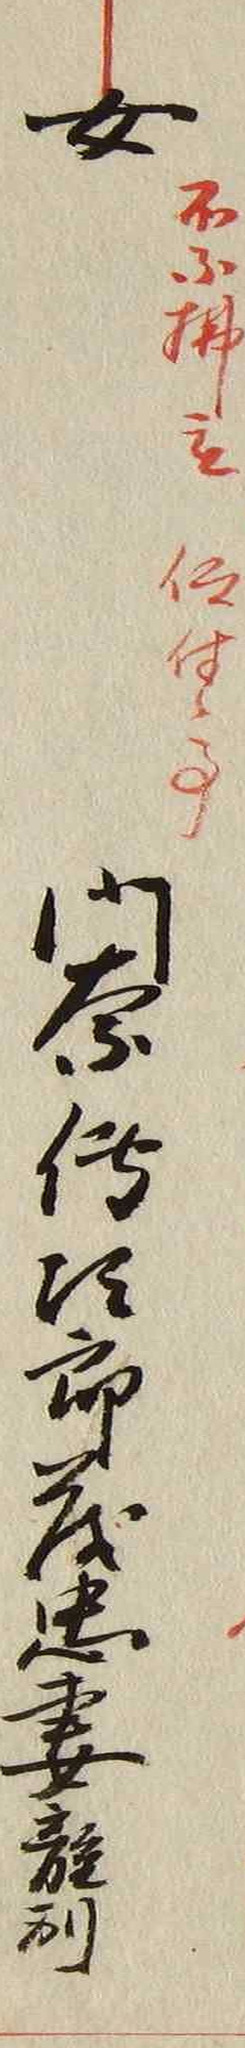女門奈伝次郎茂忠妻離別
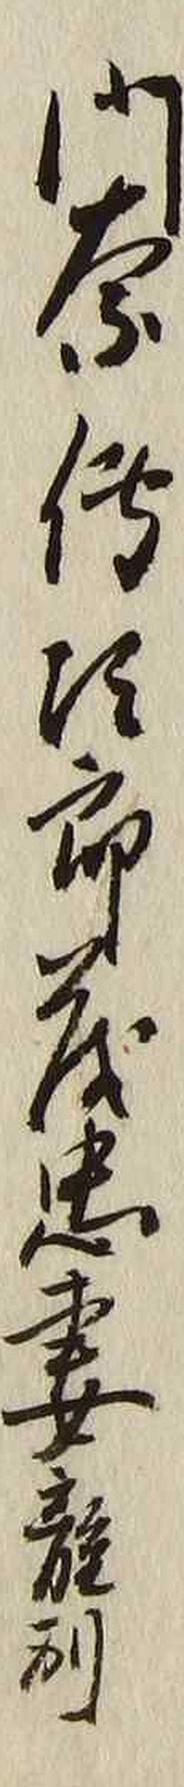女門奈伝次郎茂忠妻離別
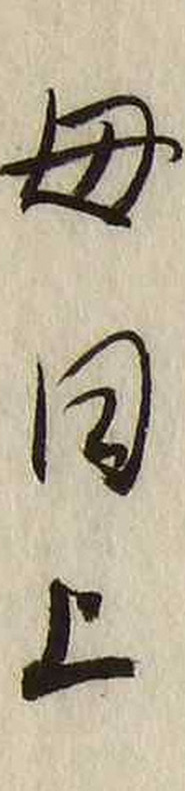母同上

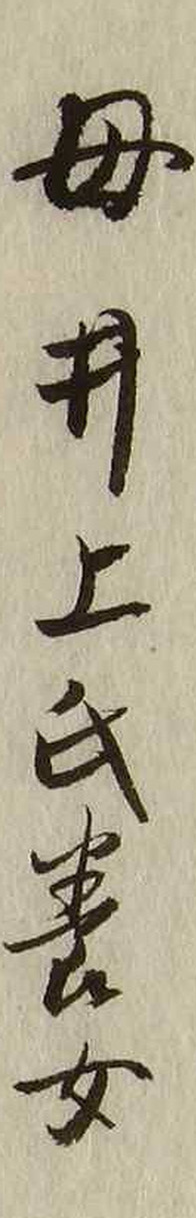母井上氏養女
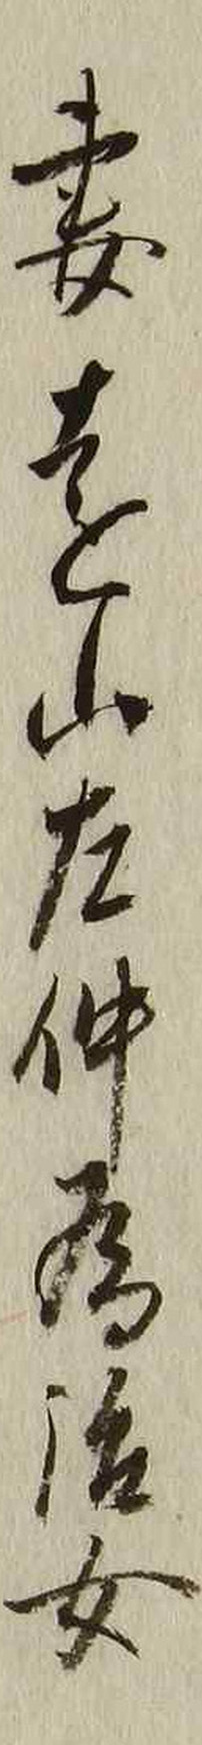妻遠山左仲為治女
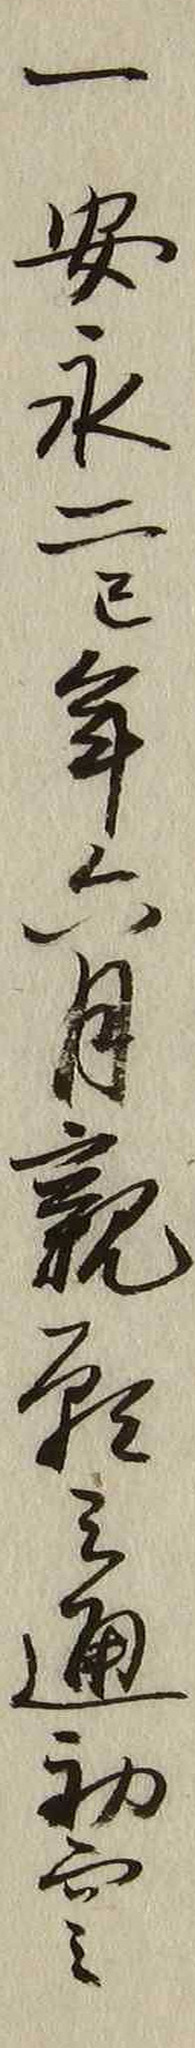一安永二巳年六月親願之通初而之
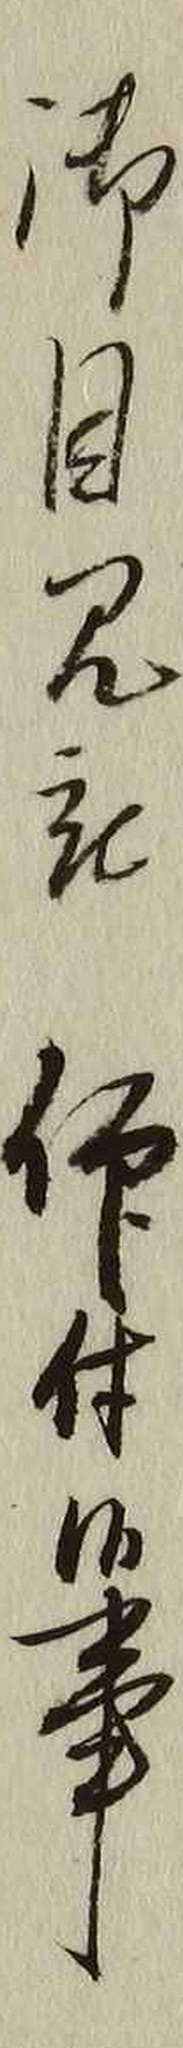御目見被仰付候事
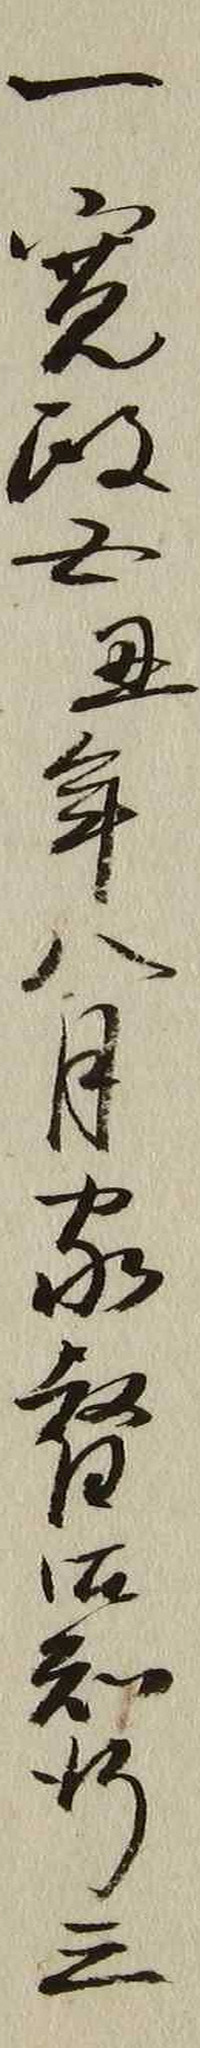一寛政五丑年八月家督御所知行三
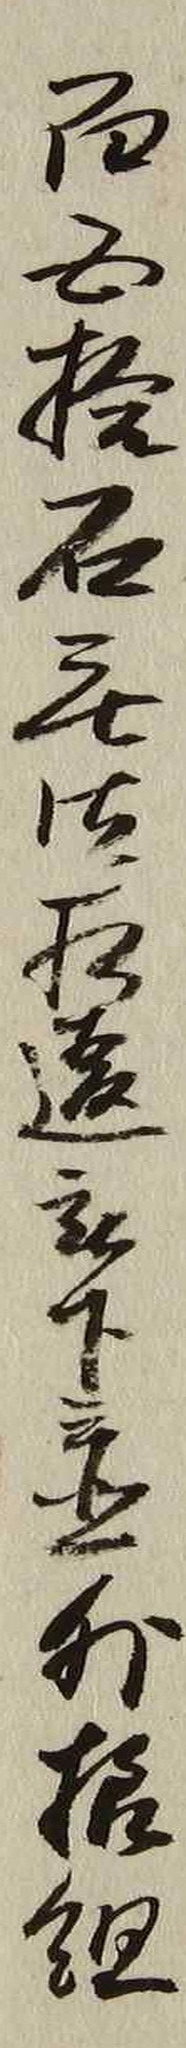百五拾石無御相違被下置外様組
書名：諸士系譜　巻之356　す之部6
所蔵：会津若松市立会津図書館
